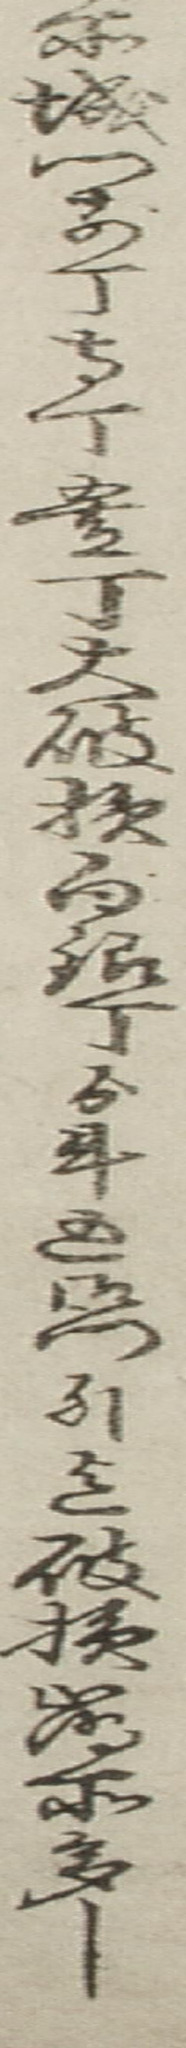赤城門前丁寺丁畳丁大破損白銀丁ゟ牛込御門外迄破損崩所多し
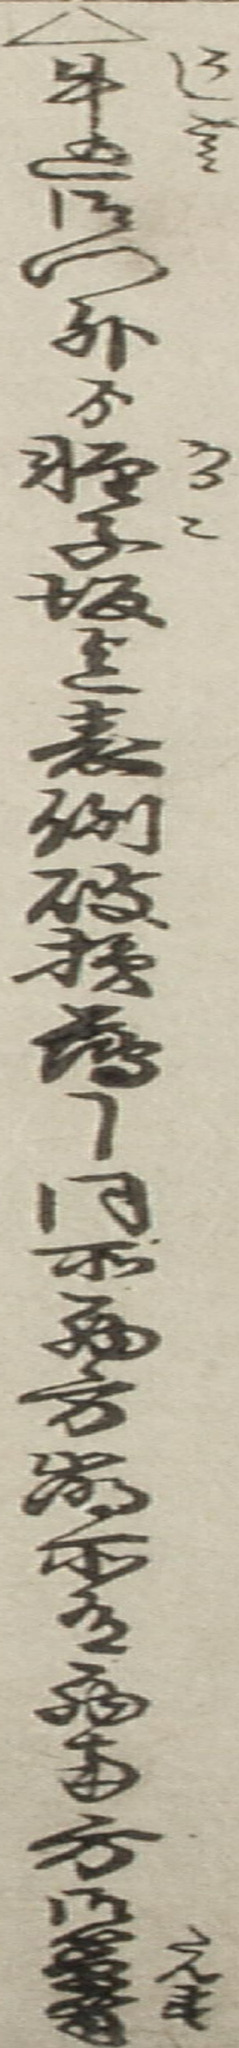△牛込御門外ゟ軽子坂迄表側破損薄し同所西方崩所有西南方御箪笥
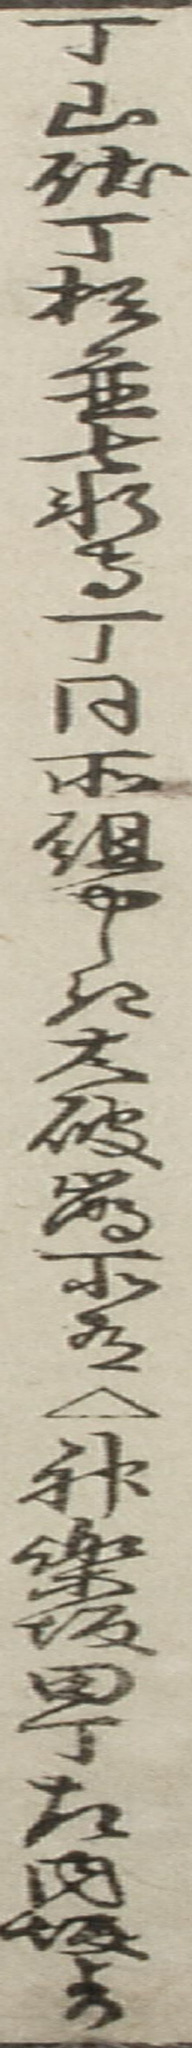丁山伏丁杉並七軒寺丁同所組やしき大破崩所有△神楽坂田丁左内坂より
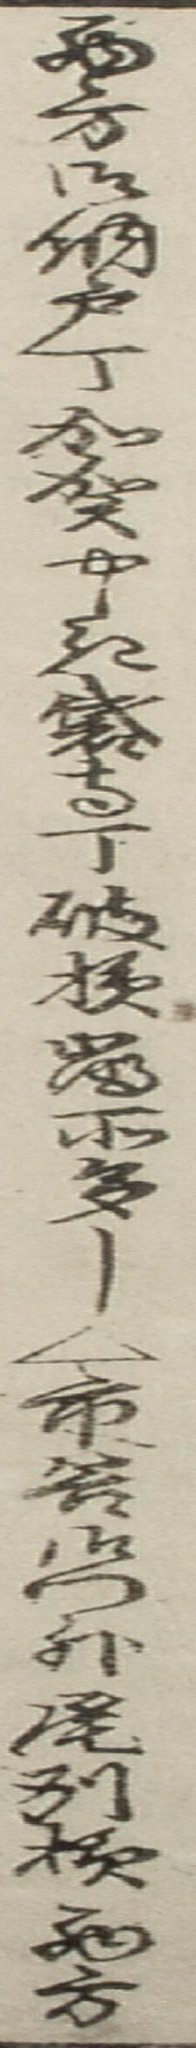西方御納戸丁加賀やしき袋寺丁破損崩所多し△市谷御門外尾州様西方
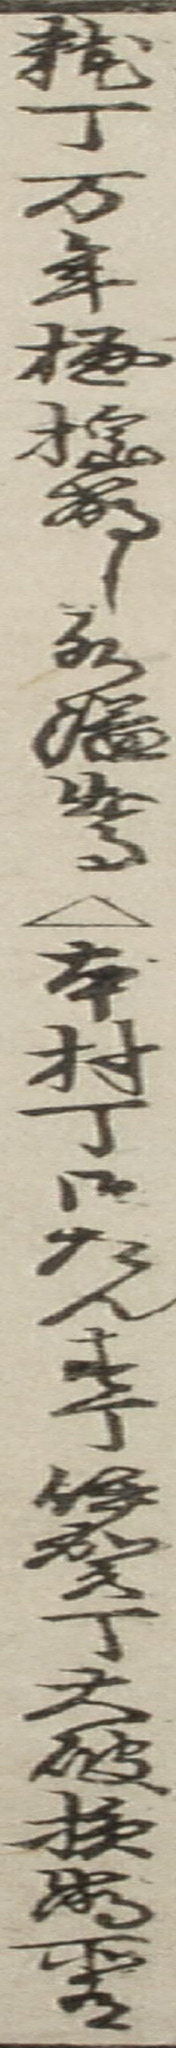糀丁万年樋揺崩水溢出る△本村丁御たんす丁伊賀丁大破損崩所有
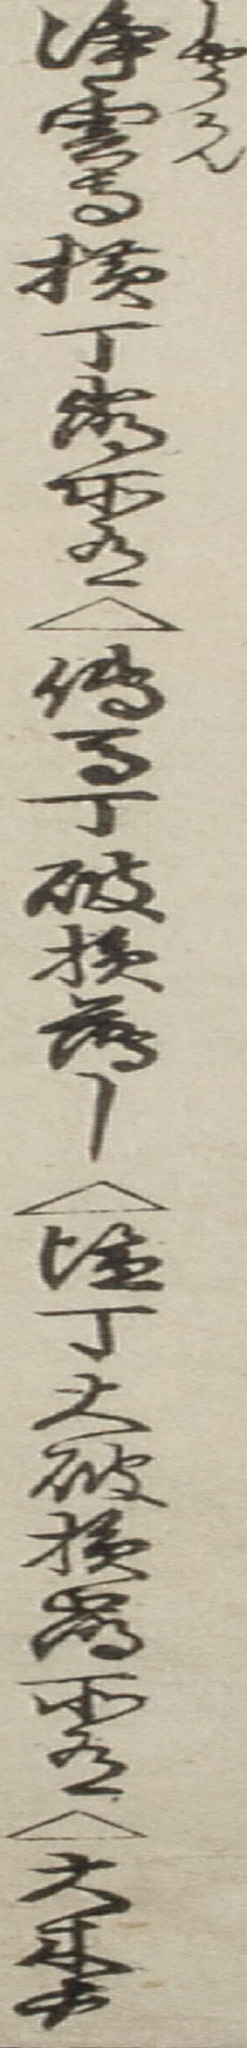浄雲寺横丁崩所有△伝馬丁破損薄し△塩丁大破損崩所有△大木戸
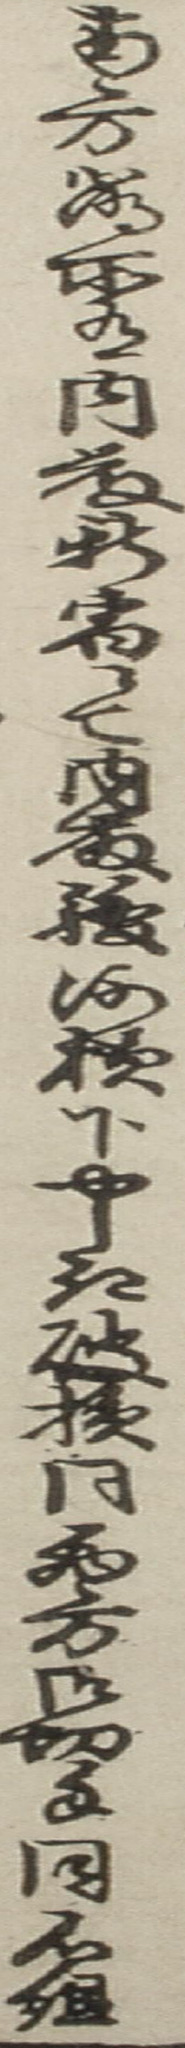南方崩所有内藤新宿ニて内藤駿河様下やしき破損同西方御切手同不組
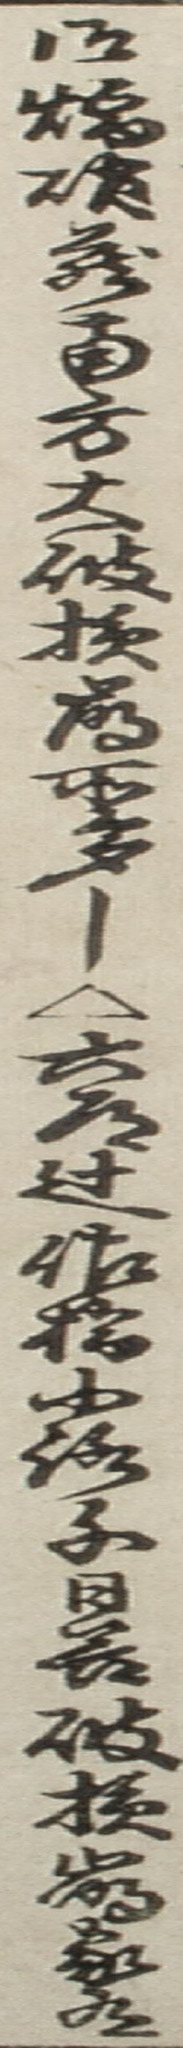御焔硝蔵南方大破損崩所多し△六道辻佐橋小路千日谷破損崩家有
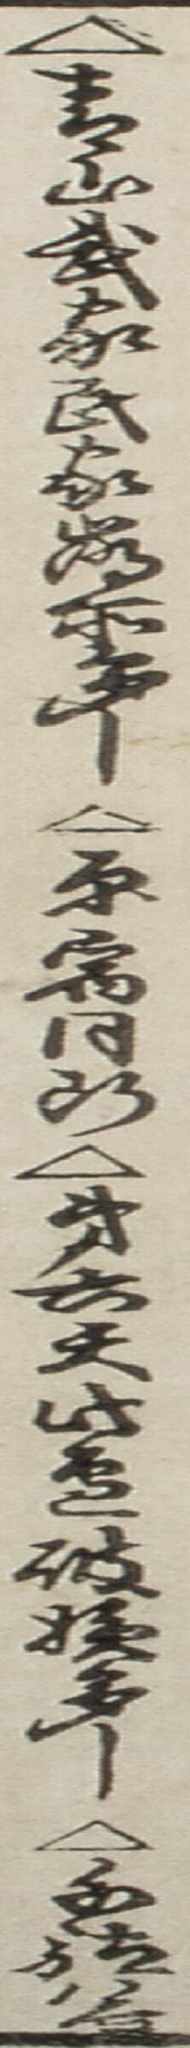△青山武家民家崩所多し△原宿同断△第六天此辺破損多し△千駄谷
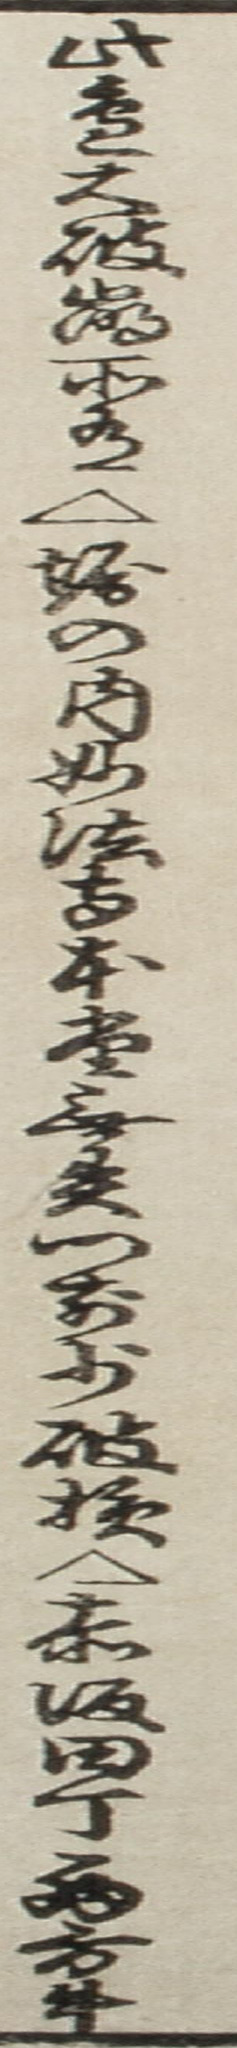此辺大破崩所有△堀の内妙法寺本堂無異門前少破損△赤坂田丁西方牛
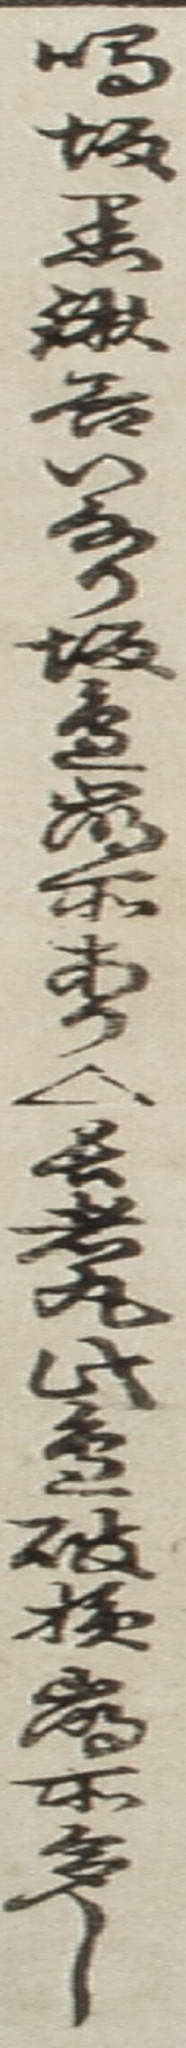鳴坂黒鍬谷いなり坂辺崩所あり△長者丸此辺破損崩所多し
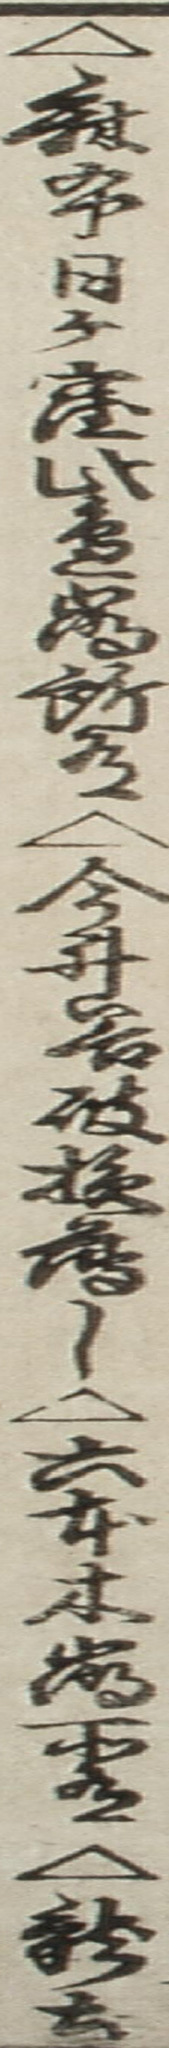△麻布日ケ窪此辺崩所有△今井谷破損薄し△六本木崩所有△龍土
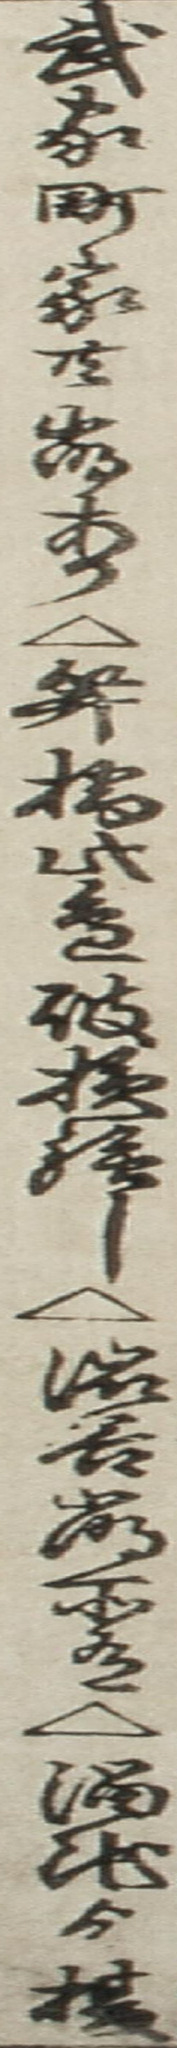武家町家共崩あり△笄橋此辺破損強し△渋谷崩所有△溜池ゟ榎
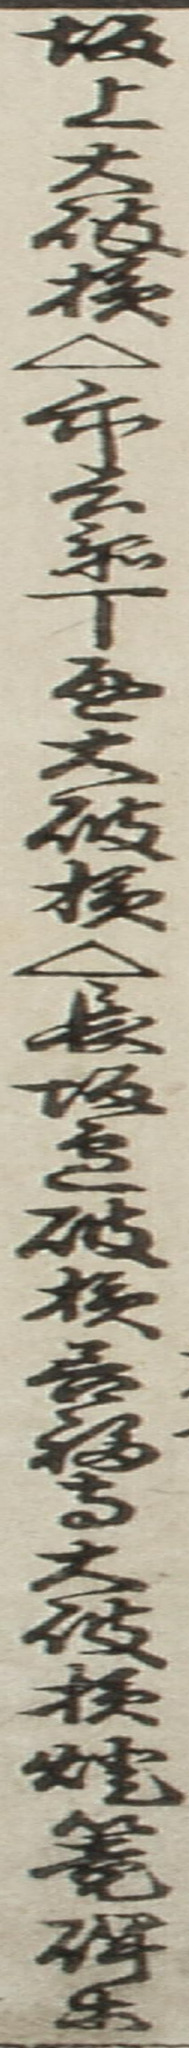坂上大破損△市兵衛丁通大破損△長坂辺破損善福寺大破損燈篭碑等
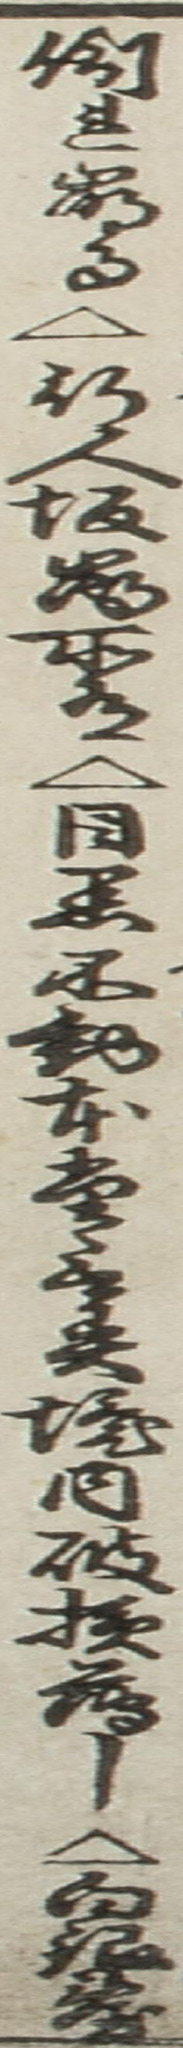倒れ崩る△行人坂崩所有△目黒不動本堂無異境内破損薄し△白銀臺
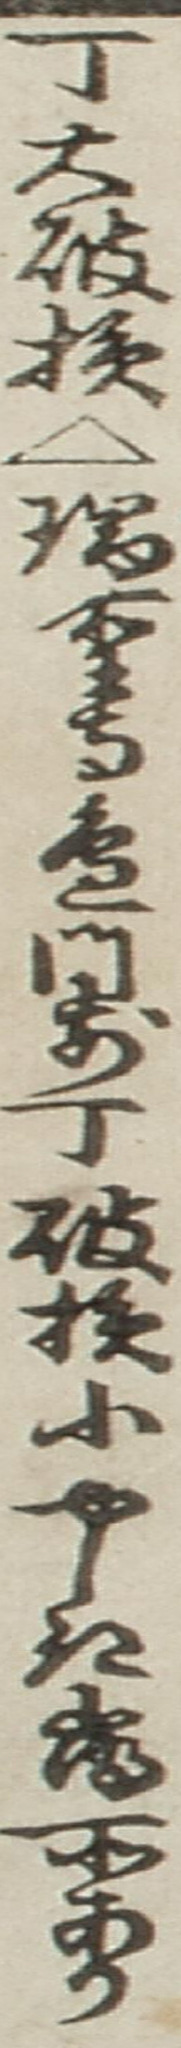丁大破損△瑞聖寺辺門前丁破損小やしき崩所あり
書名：安政見聞誌　下
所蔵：東京大学地震研究所図書室 Earthquake Research Institute Library, The University of Tokyo, JAPAN
